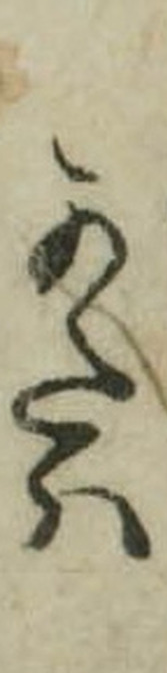かたは
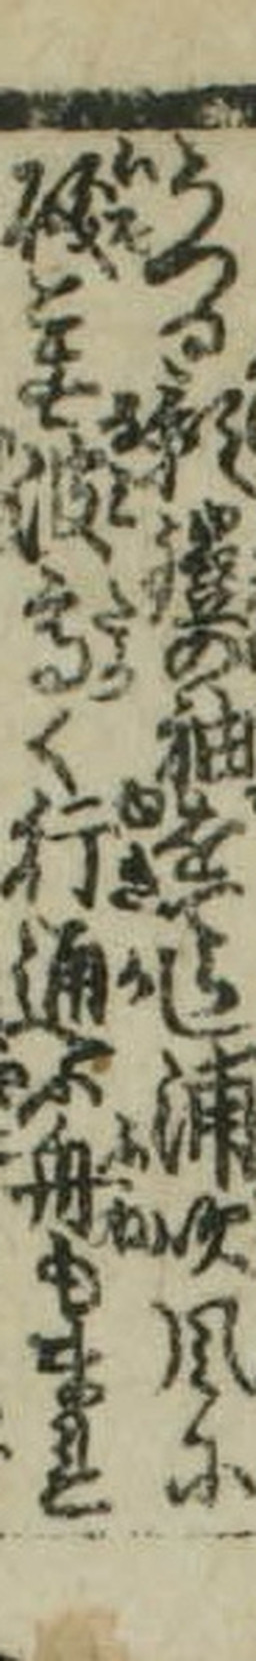磯こす波高く行通ふ舟もまれ
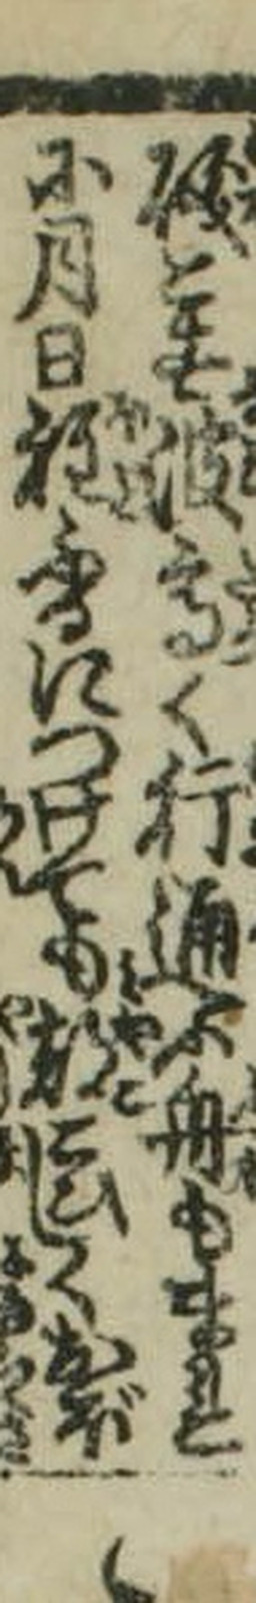に月日程ふるにつけても都こひしくおぼ
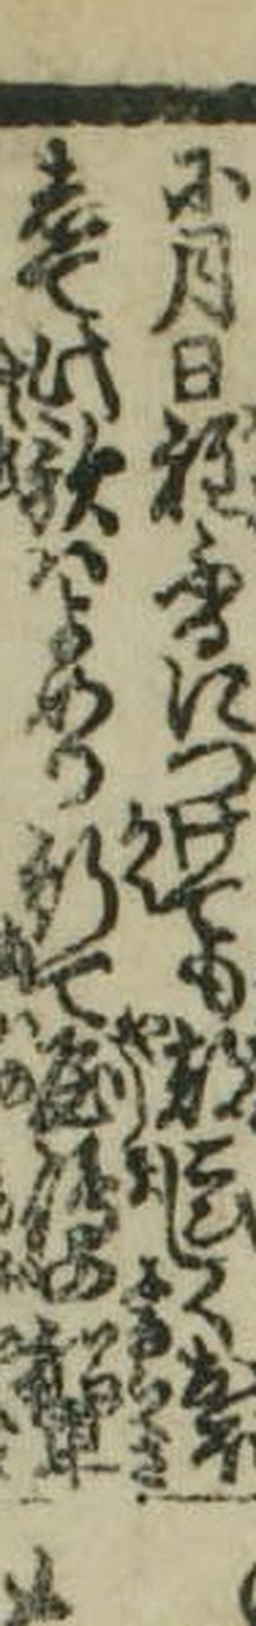して此歌はよめり斯て屋嶋の船軍
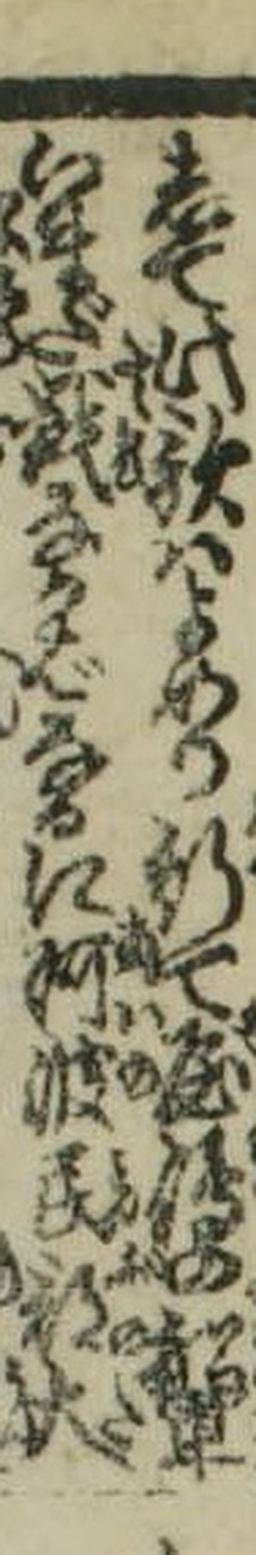いまだ戦なかばなるに阿波民部大
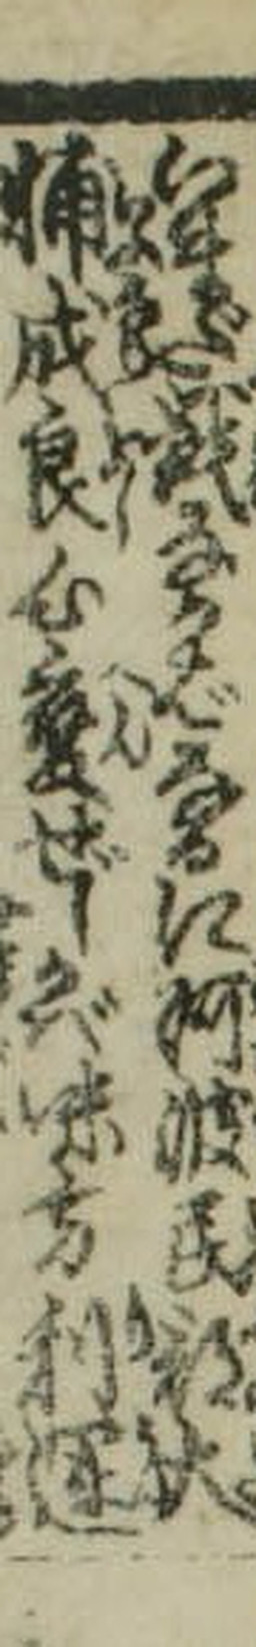輔成良心変ぜしかば味方利運
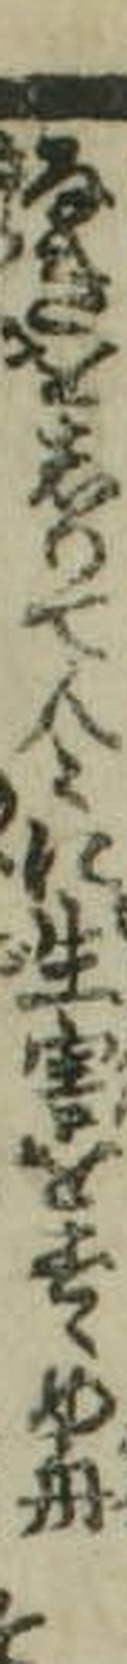なきをしりて人々に生害をすゝめ舟
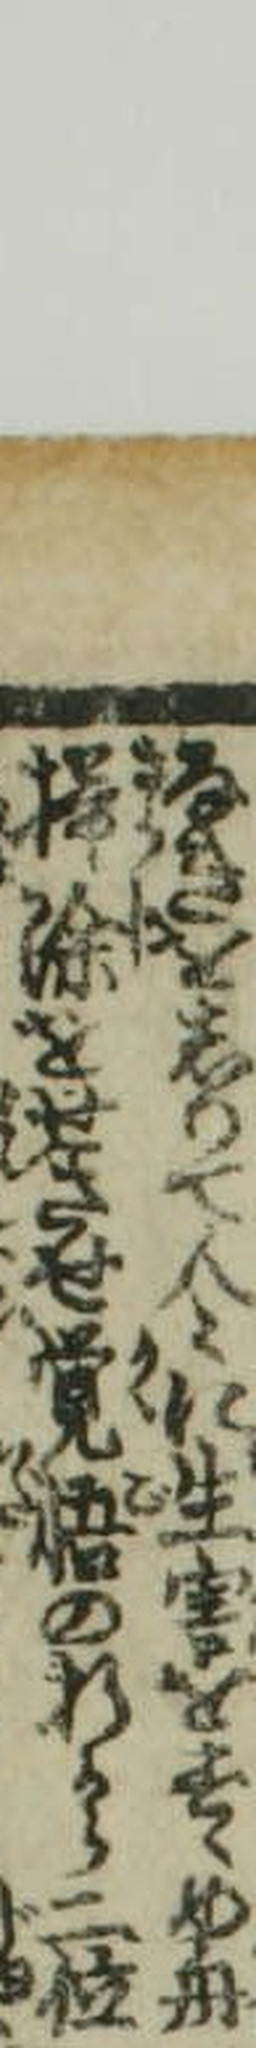掃除をせさせ覚悟の折から二位
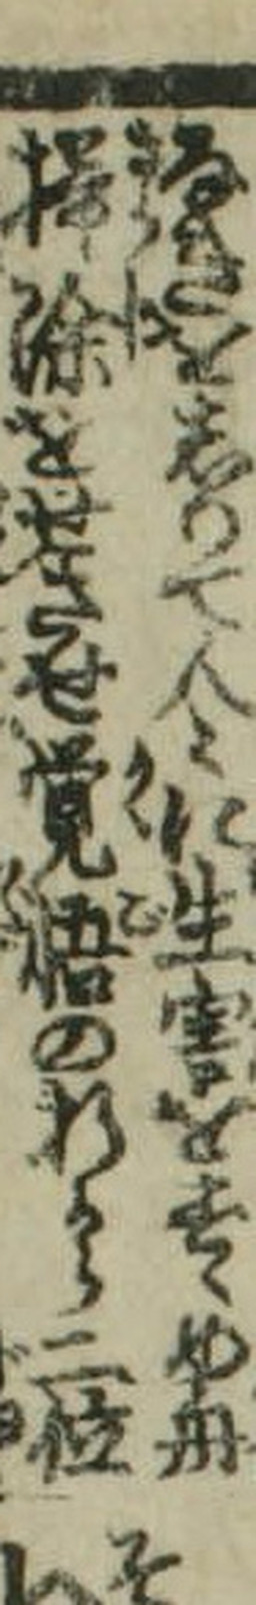掃除をせさせ覚悟の折から二位
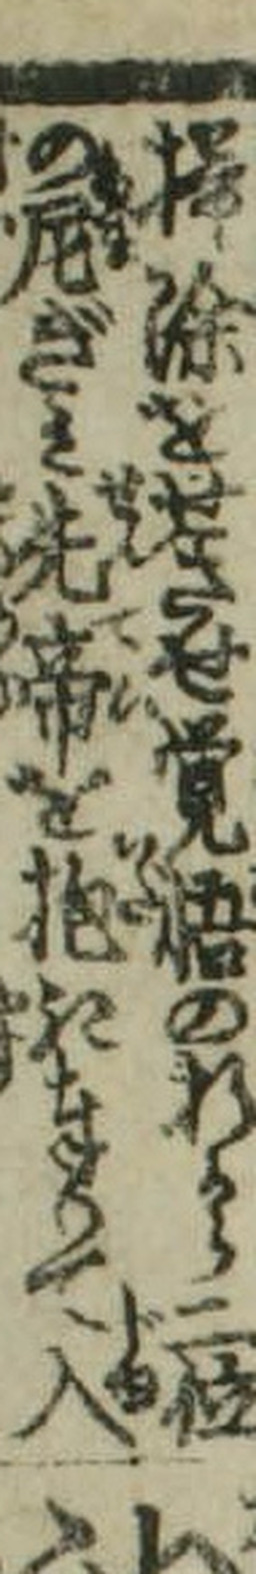の尼ぎみ先帝を抱き奉りて入
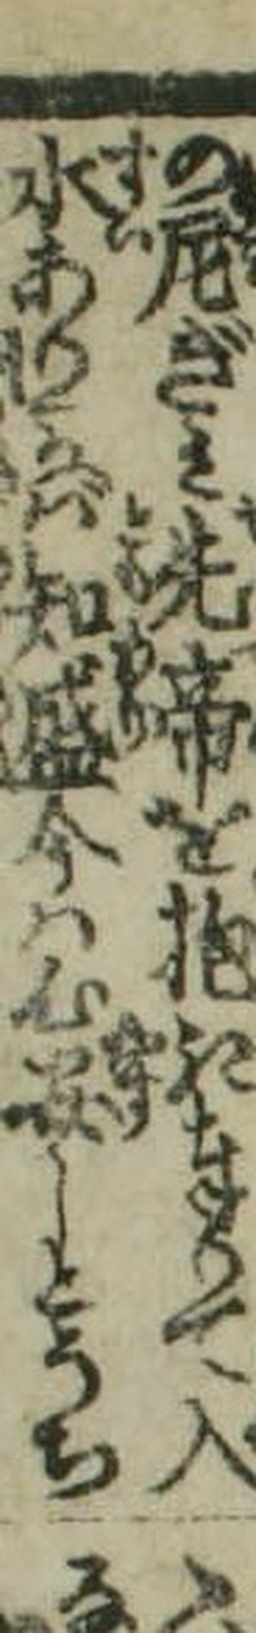水ありしかば知盛今は心安しとうち
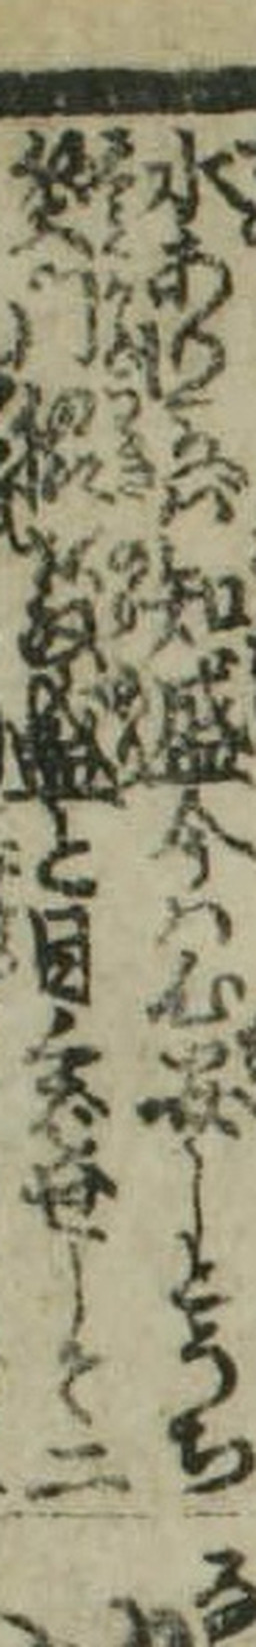笑門脇教盛と目くばせして二
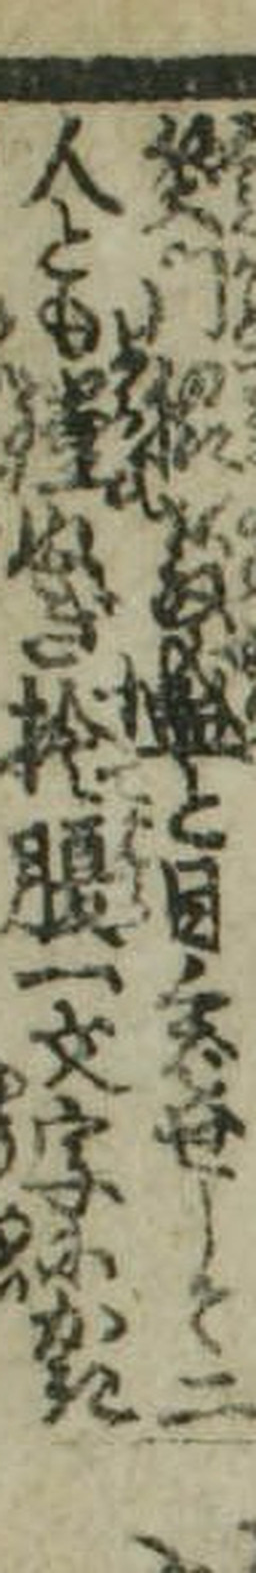人とも鎧ぬぎ捨腹一文字にかき
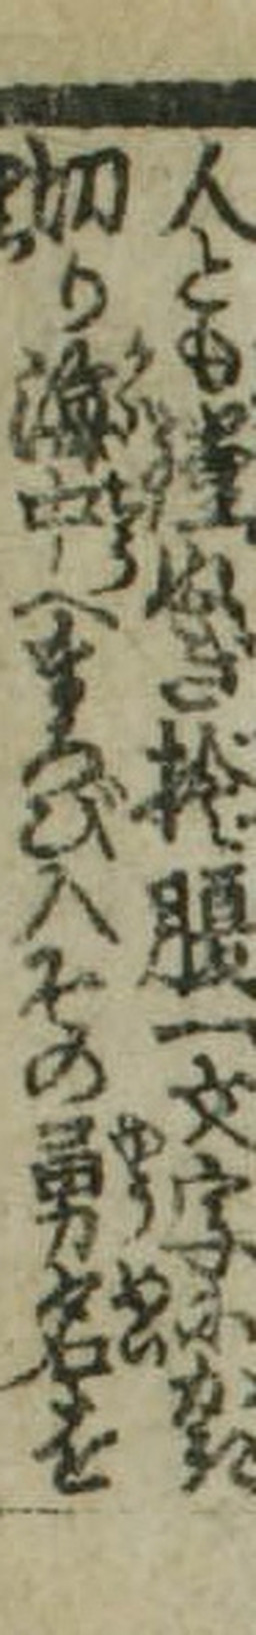切り海中へまろび入その勇名を
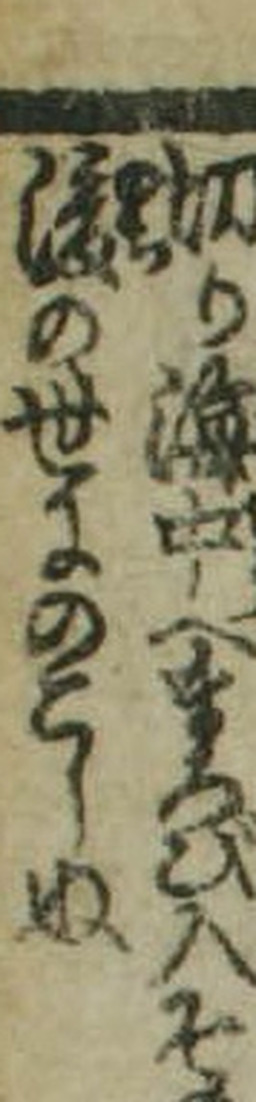後の世にのこしぬ

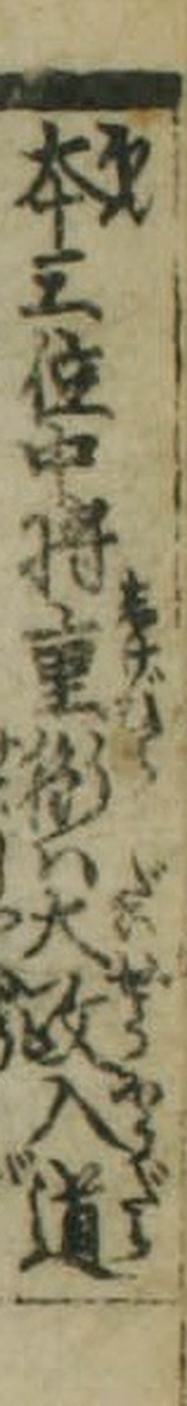本三位中将重衡は大政入道
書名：續英雄百人一首
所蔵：東京学芸大学附属図書館
